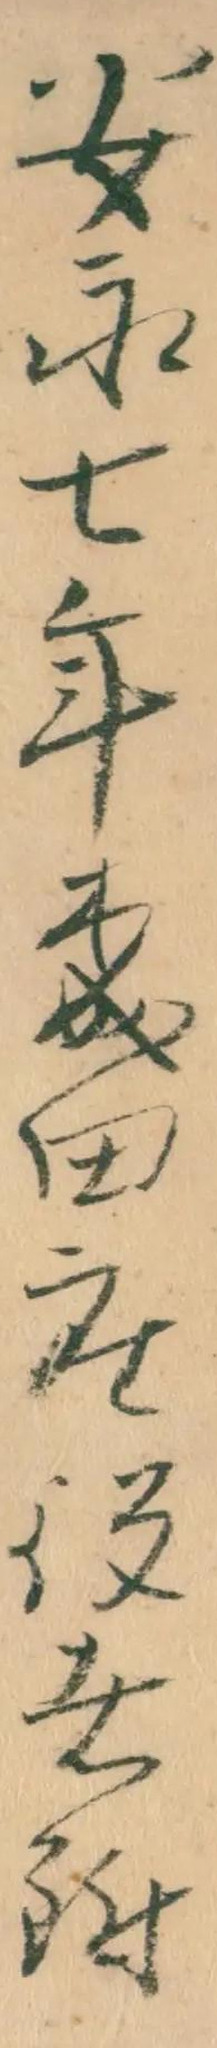安永七年森田座役者附
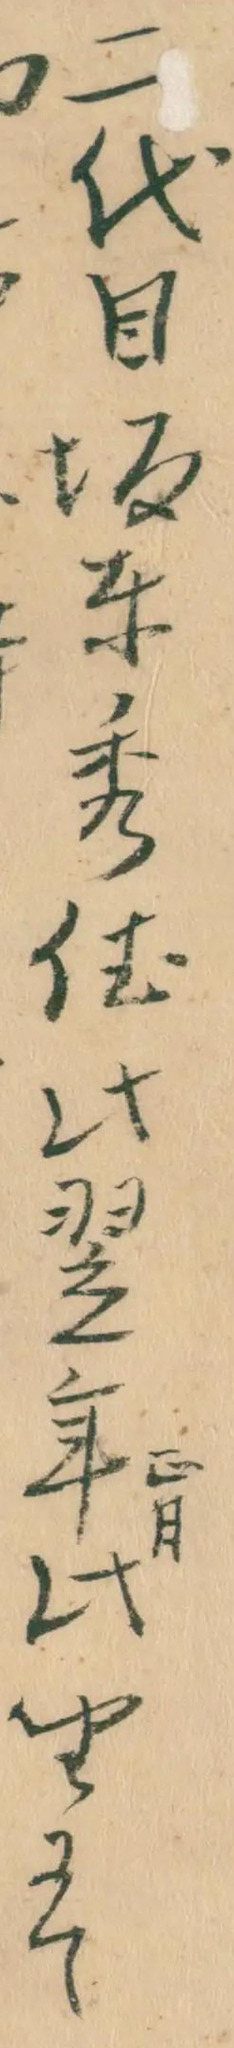二代目坂東秀佳此翌年正月此座にて
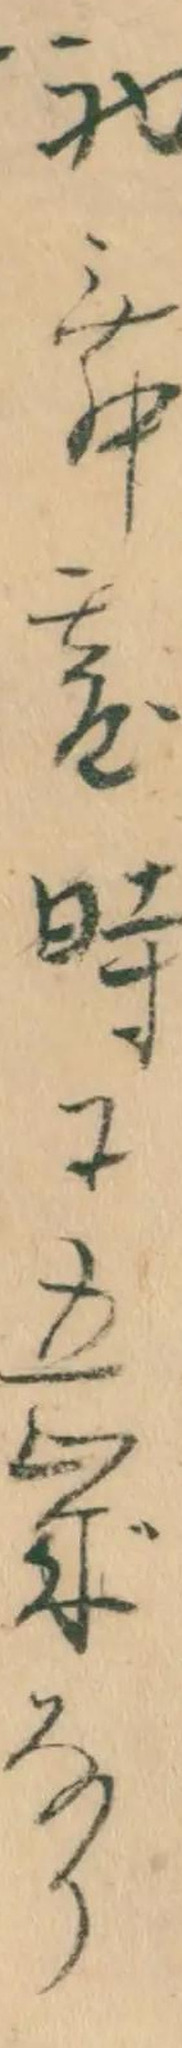初舞台時に五歳なり
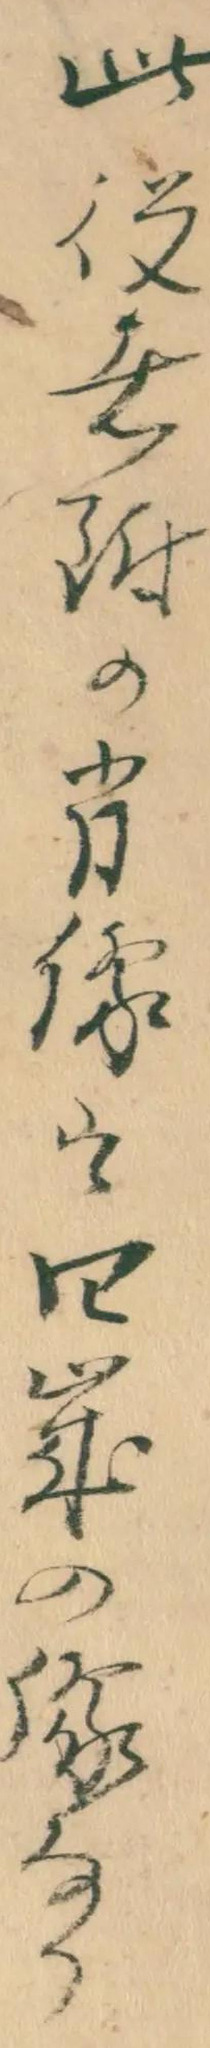此役者附の肖像は四歳の像なり

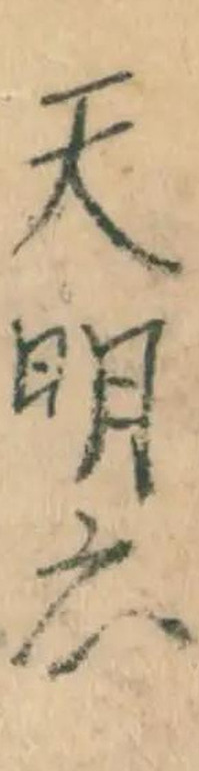天明六

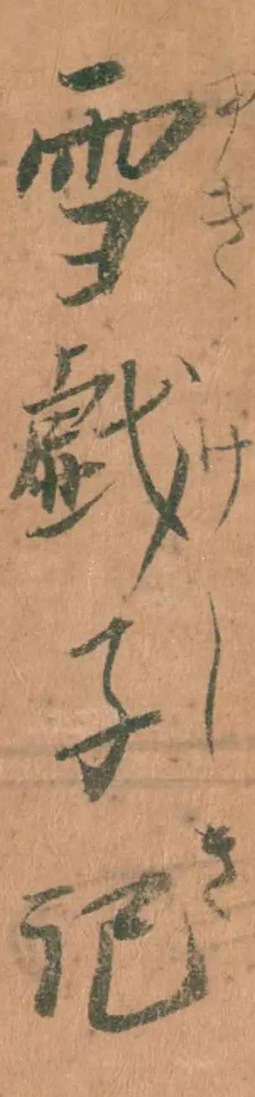雪戯子記
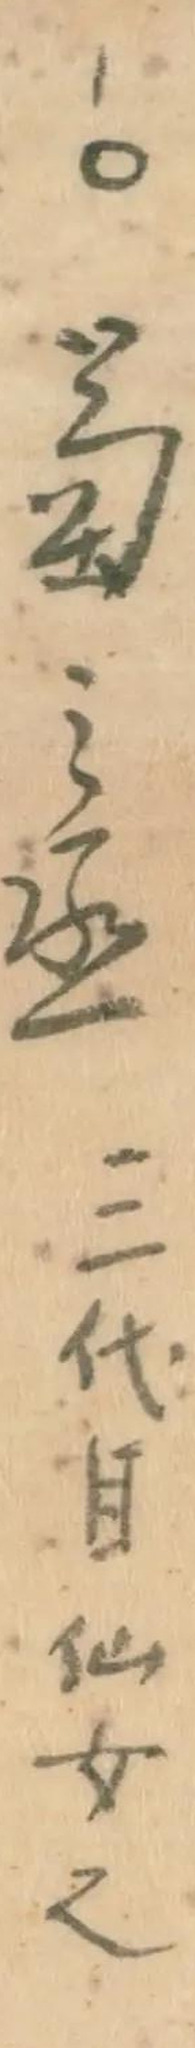ー○菊之丞三代目仙女也
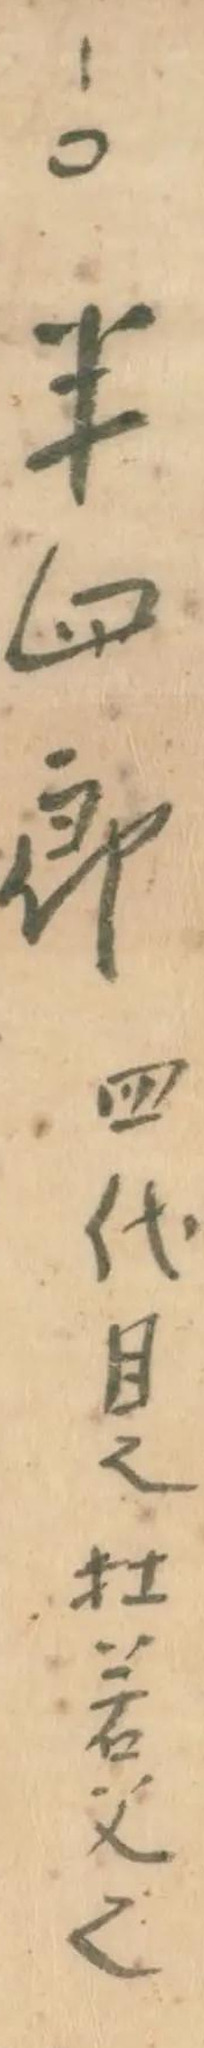ー○半四郎四代目也杜若父也

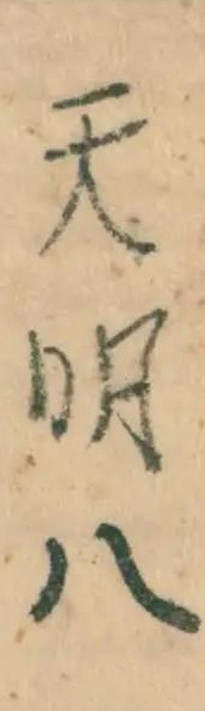天明八

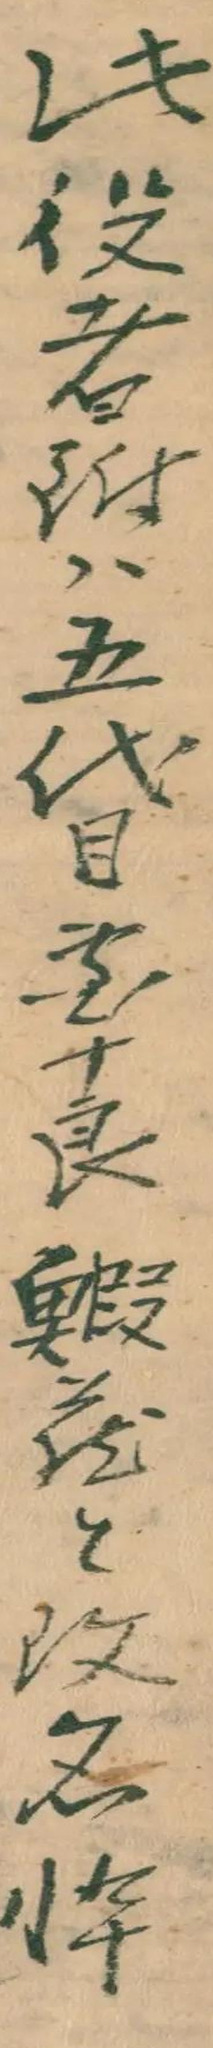此役者附は五代目団十郎蝦蔵と改名倅
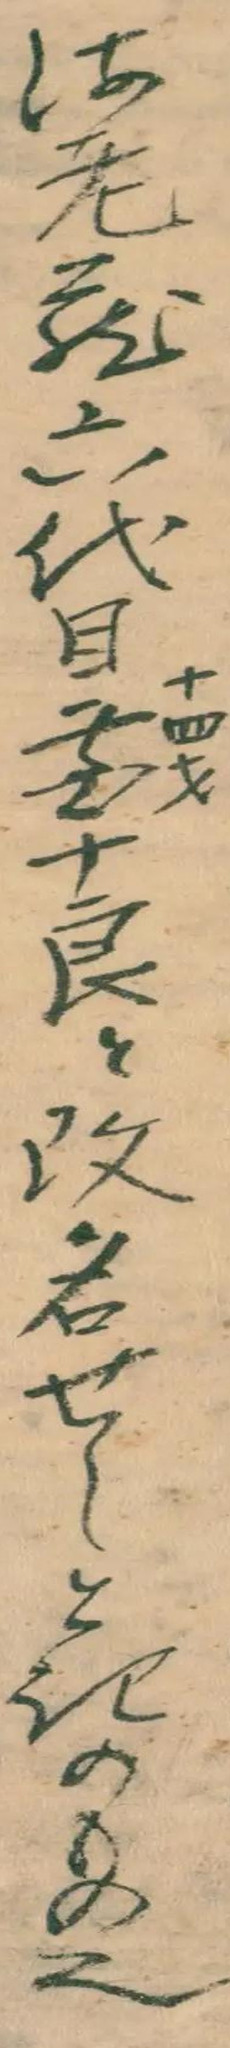海老蔵六代目団十郎と改名せしときのもの也
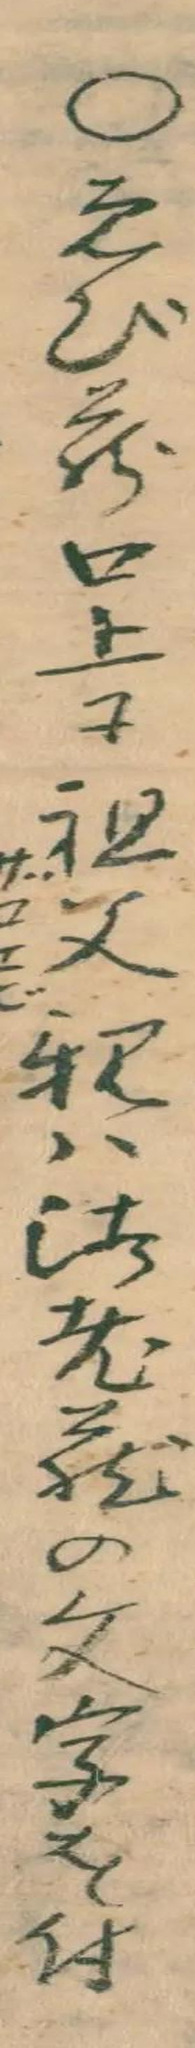○ゑび蔵口上に祖父親は海老蔵の文字を付
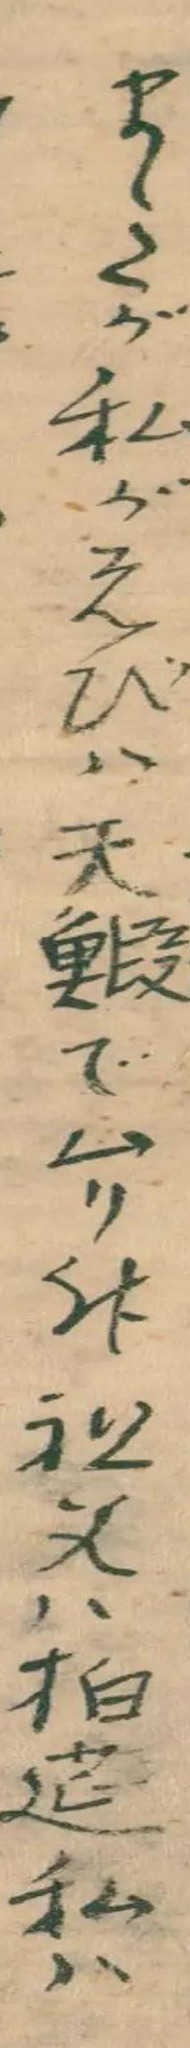ましたが私がえびは天鰕で厶り升祖父柏莚私は
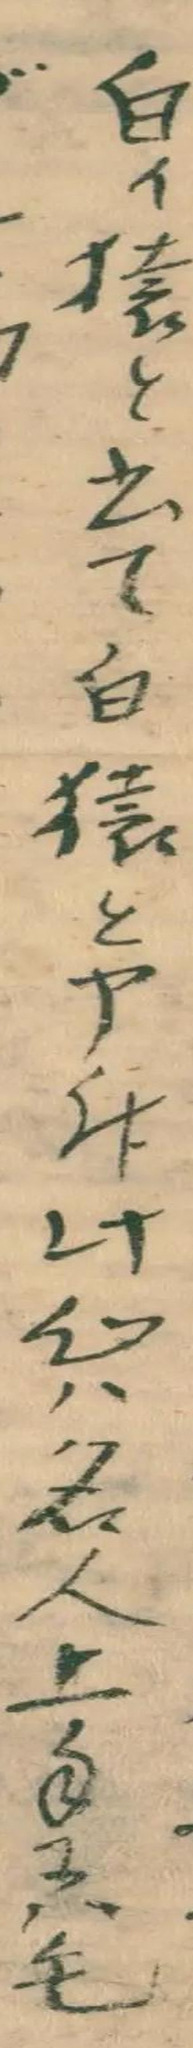白い猿と書て白猿と申升此心は名人上手には毛
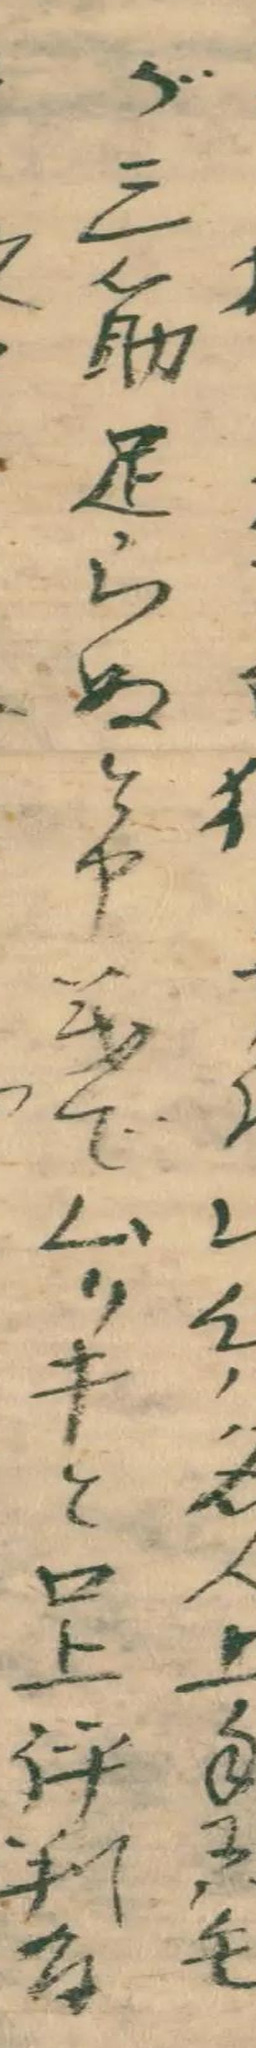が三筋足らぬと申義で厶りと口上評判有
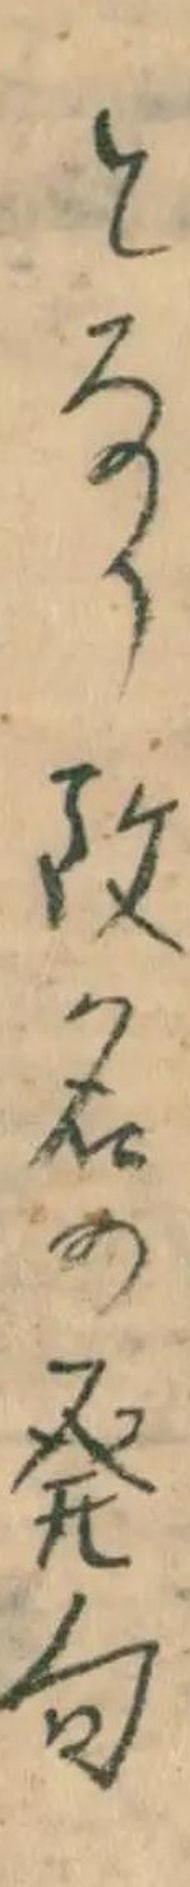となり改名の発句
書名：江戸大芝居新役者附
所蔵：国立国会図書館 National Diet Library, JAPAN
